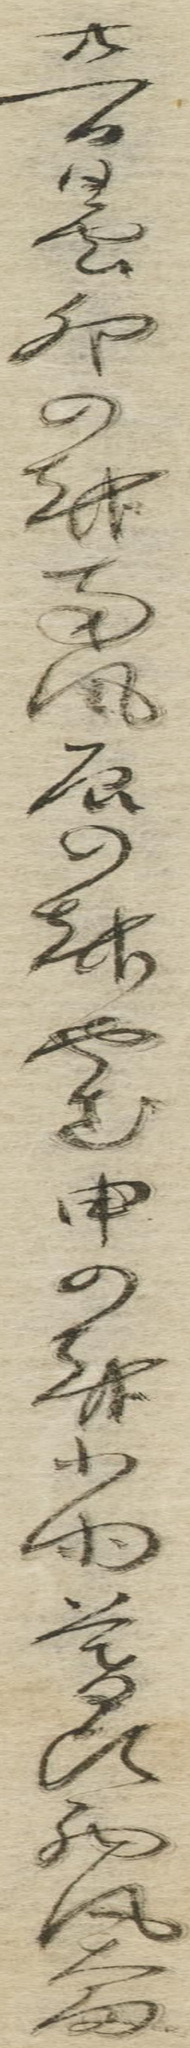廿一日曇卯の刻南風辰の刻やむ申の刻小雨暮頃西風大雨
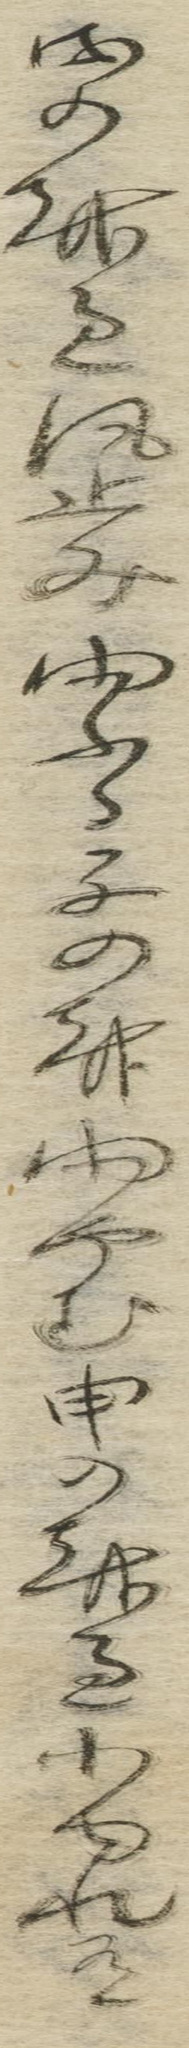戌の刻過風止み雨ふる子の刻雨やむ申の刻過小ゆれ有

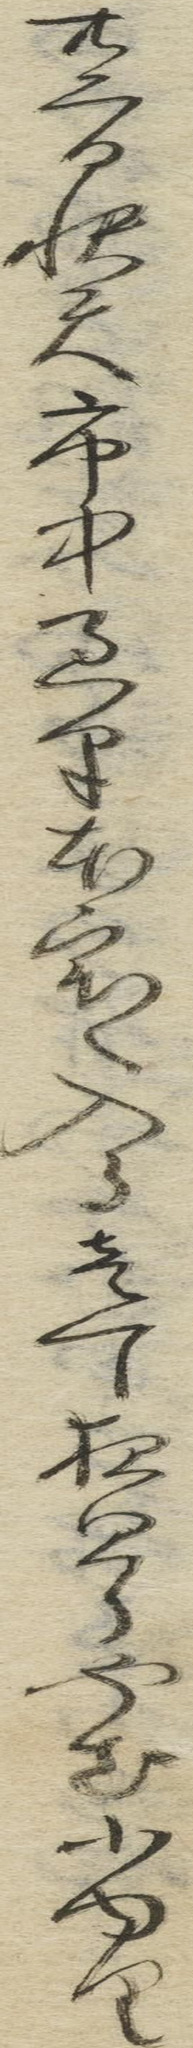廿二日快天市中過半本宅へ入る壱丁夜廻りやむ小ゆり
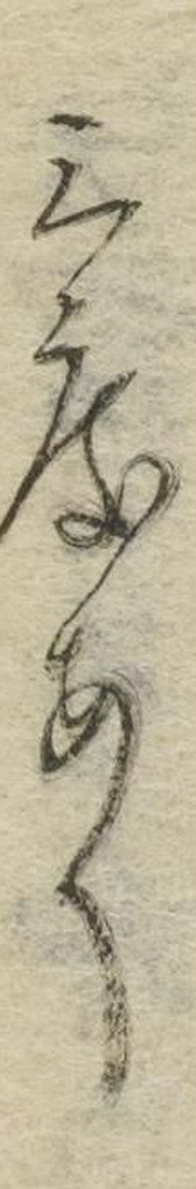三度あり
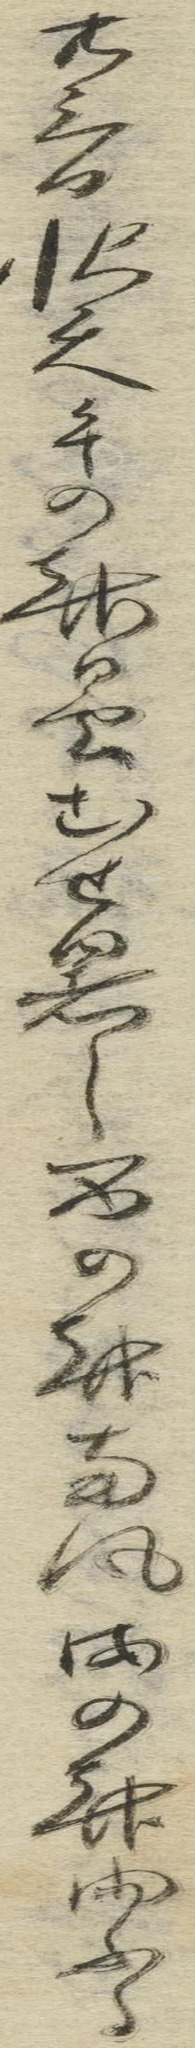廿三日快天午の刻曇むせ暑し酉の刻南風戌の刻雨ふる
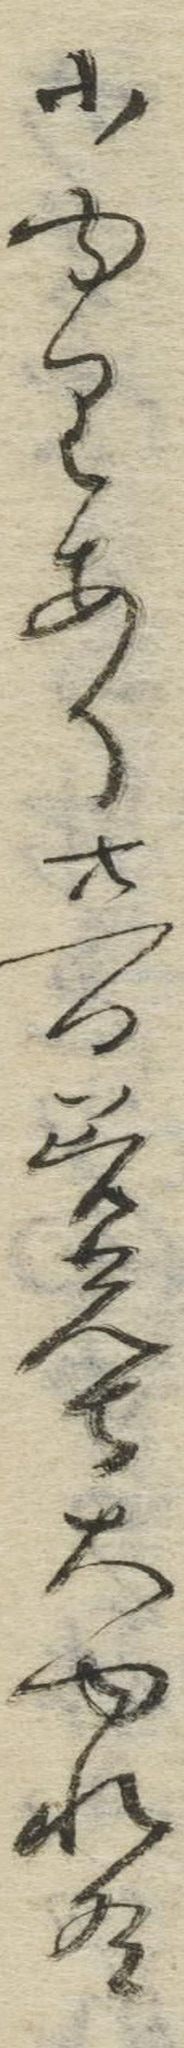小ゆりあり廿一日善光寺大ゆれ有
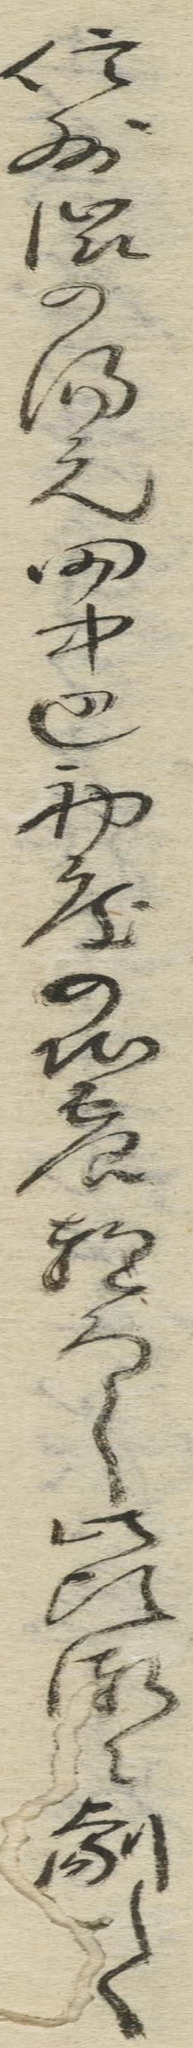信州渋の湯元田中辺初度の地震類なし此頃漸々劇しく
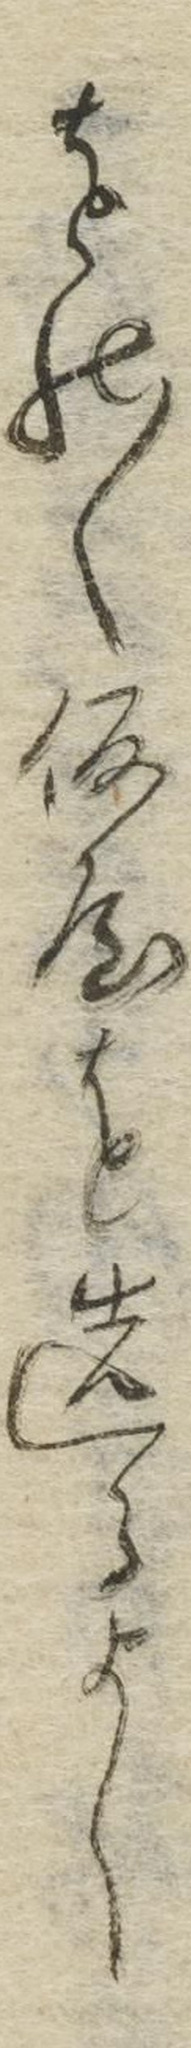をの〳〵仮屋を造るよし
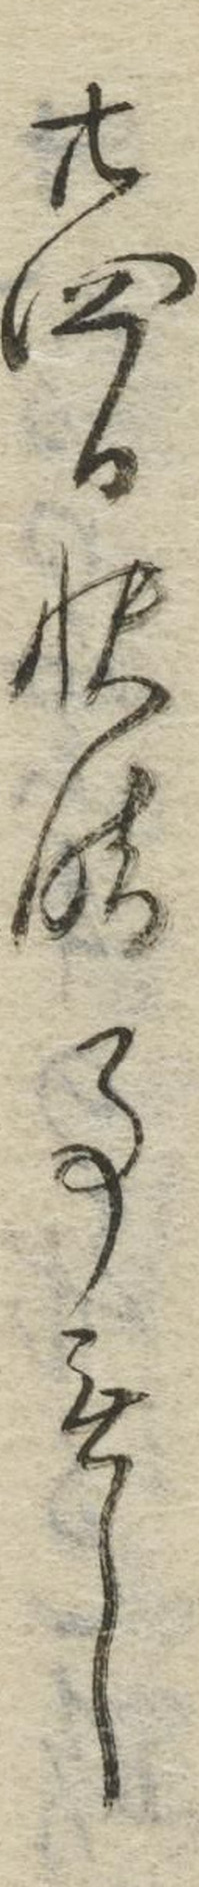廿四日快晴事無之
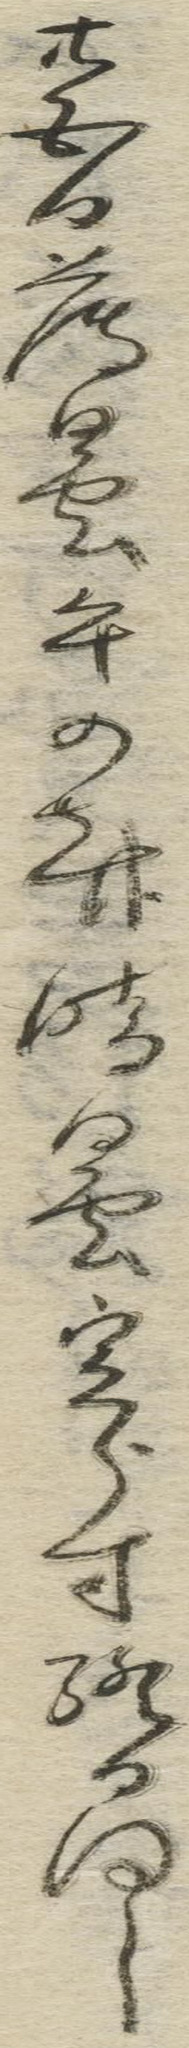廿五日薄曇午の刻晴曇定らす終日同し
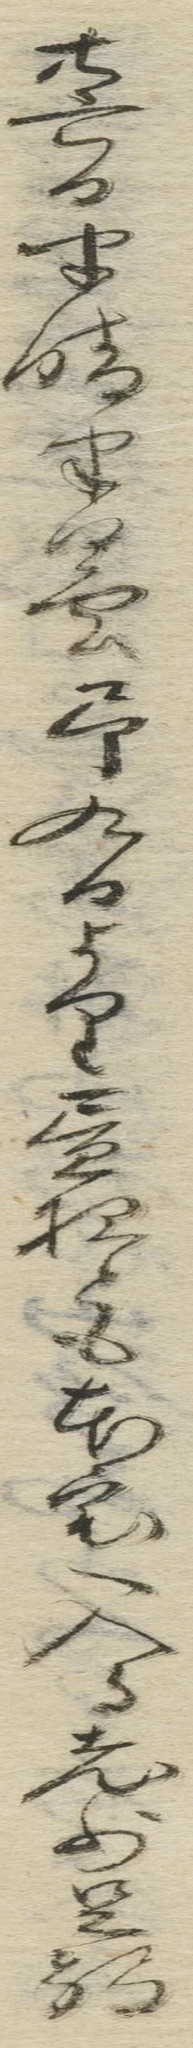廿六日半晴半曇予九日より昼夜とも本宅へ入る老少足弱
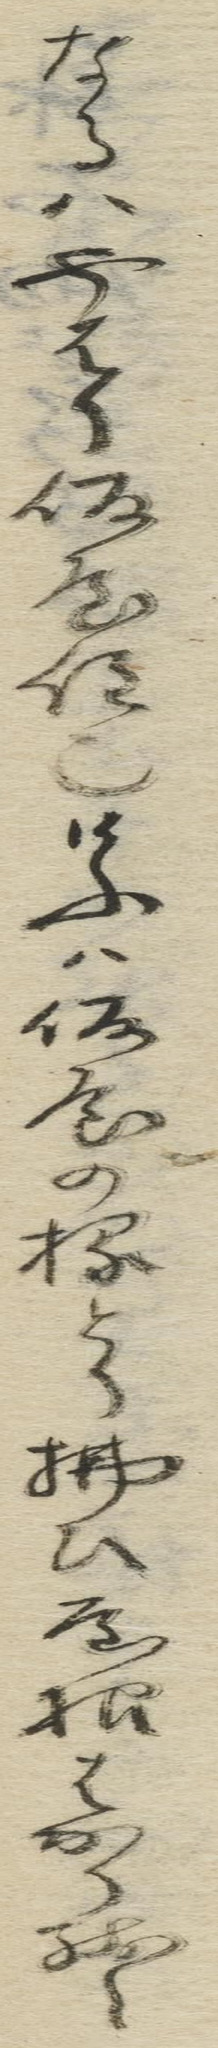ならハやはり仮屋住也けふハ仮屋の椽とり払ひ屋根はかり残し
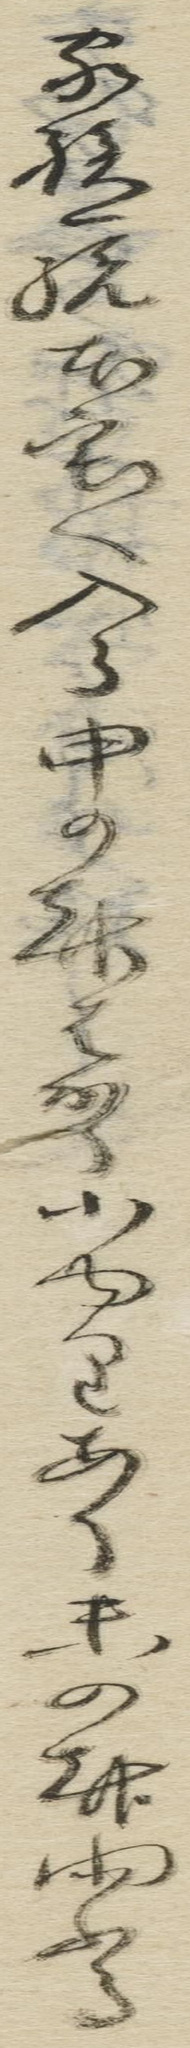家族一統本宅へ入る申の刻はかり小ゆりあり未の刻雨ふる
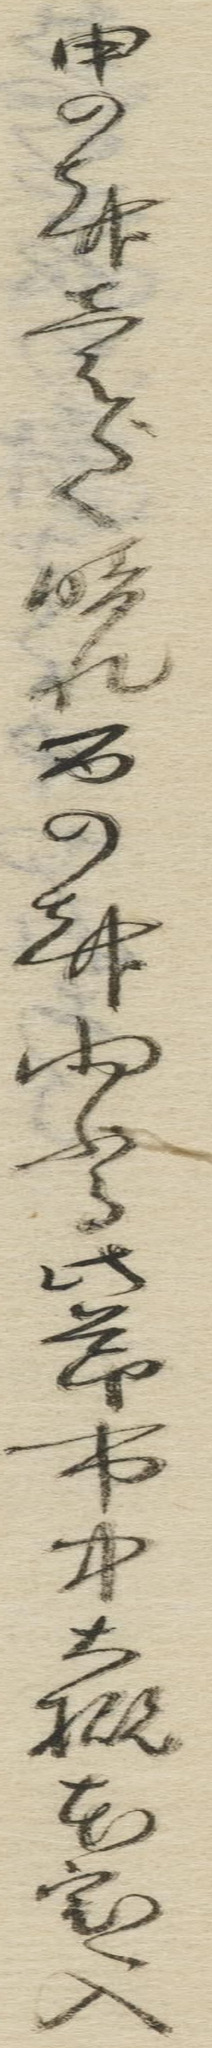申の刻しはらく晴れ酉の刻雨ふる此節市中大概本宅へ入る
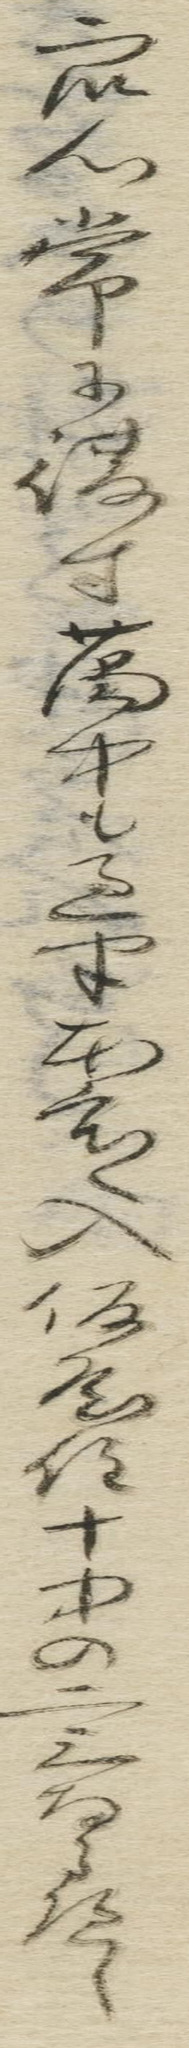衆心常に復す藩中も過半本宅へ入仮屋住十中二三なるへし
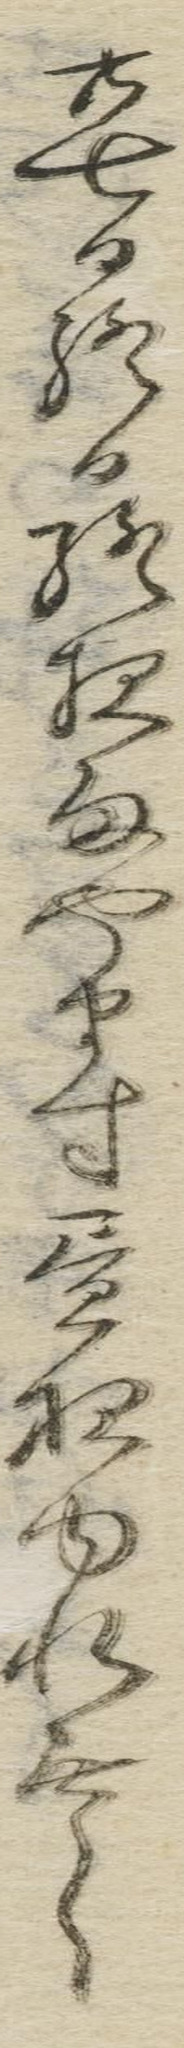廿七日終日終夜雨やます昼夜ゆれなし
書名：弘化丁未天變日記
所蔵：東京大学地震研究所図書室 Earthquake Research Institute Library, The University of Tokyo, JAPAN
